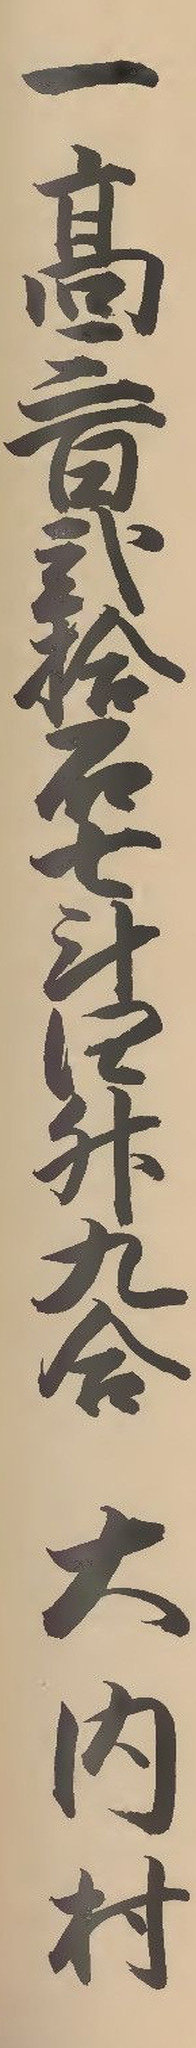一髙三百弐拾石七斗四升九合大内村
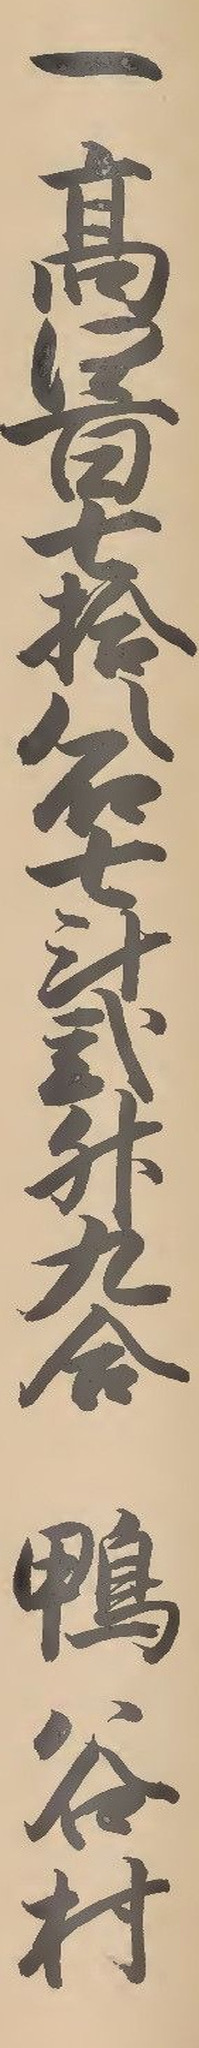一髙四百七拾八石七斗弐升九合鴨谷村
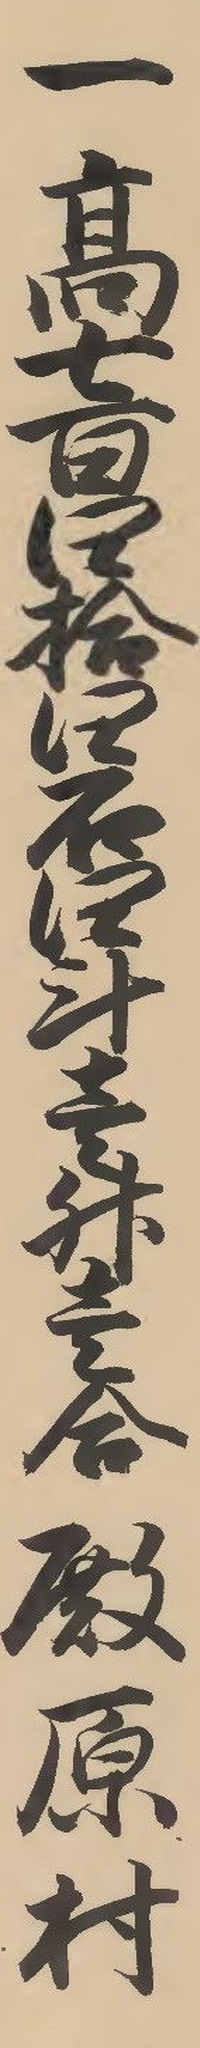一髙七百四拾四石四斗壱升壱合殿原村
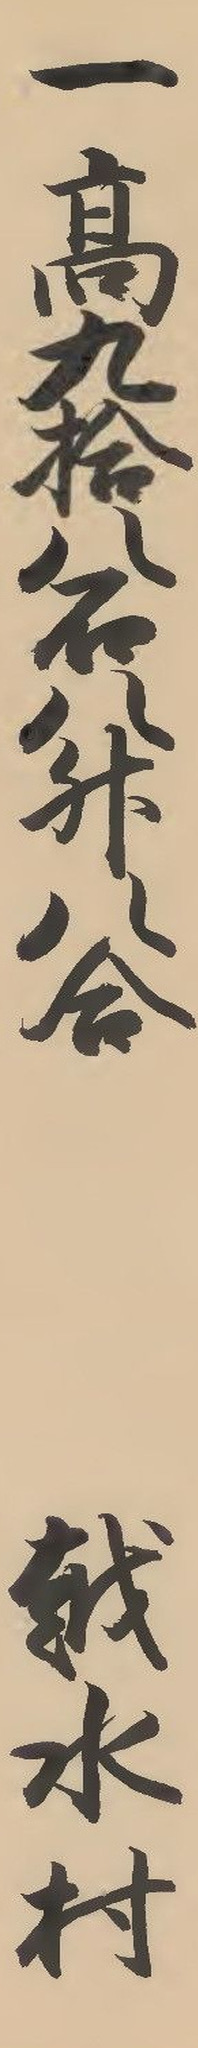一髙九拾八石八升八合越水村
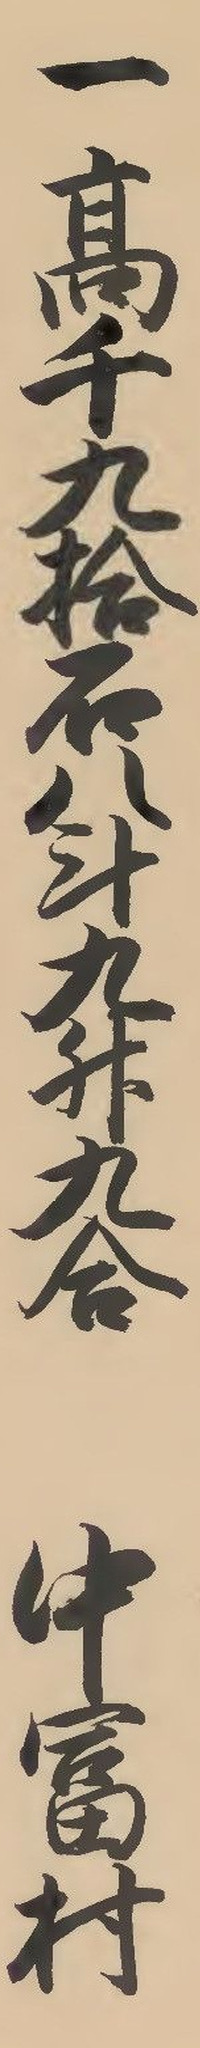一髙千九拾石八斗九升九合中冨村

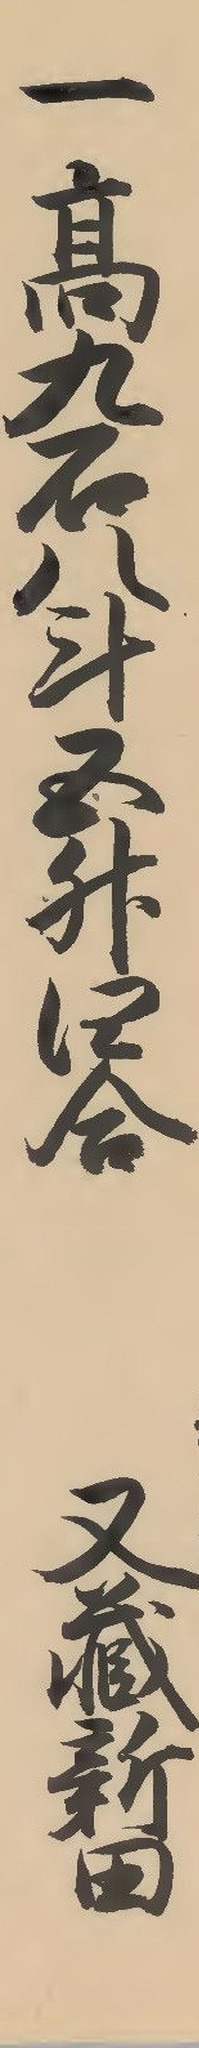一髙九石八斗五升四合又藏新田
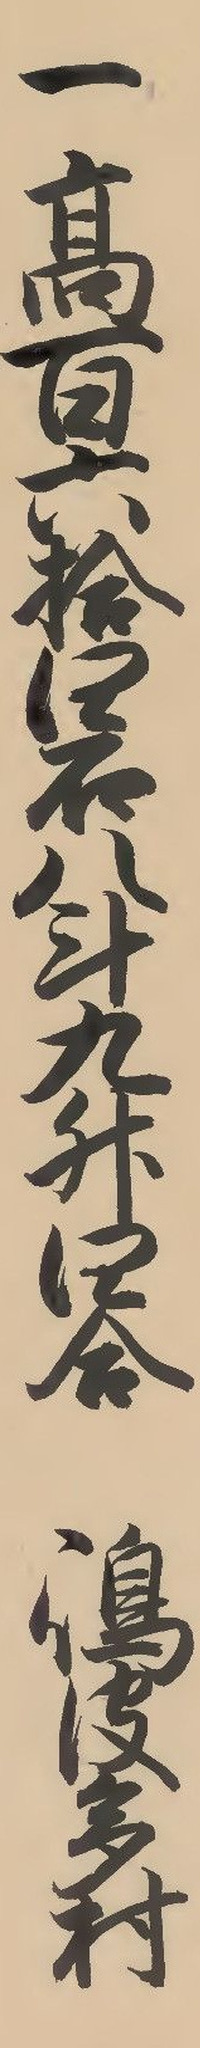一髙百六拾四石八斗九升四合嶋皮多村
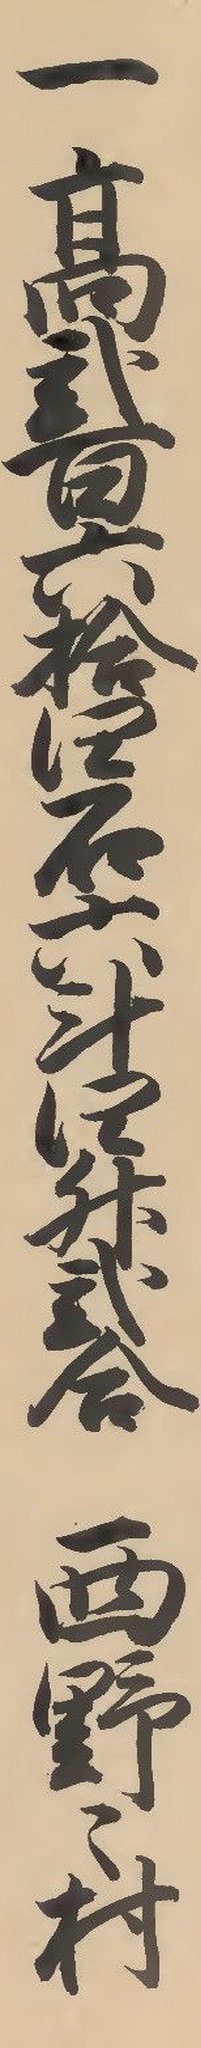一髙弐百六拾四石六斗四升弐合西野々村
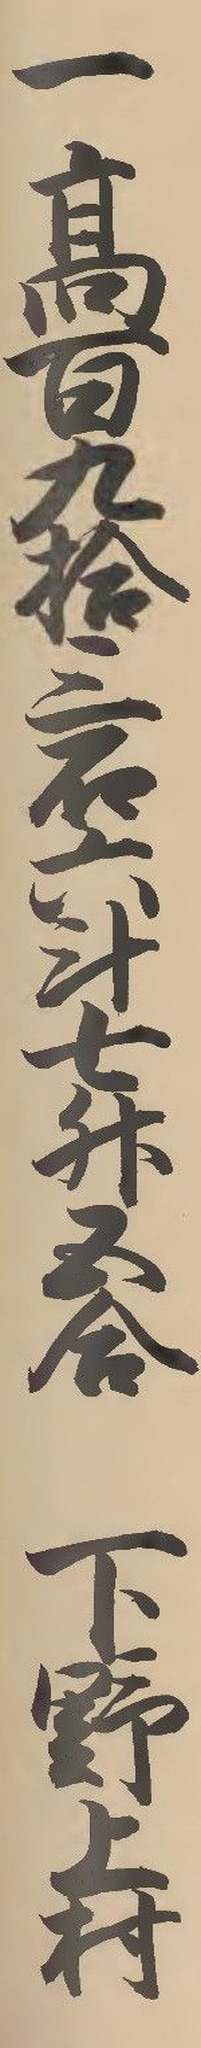一髙百九拾三石六斗七升五合下野上村
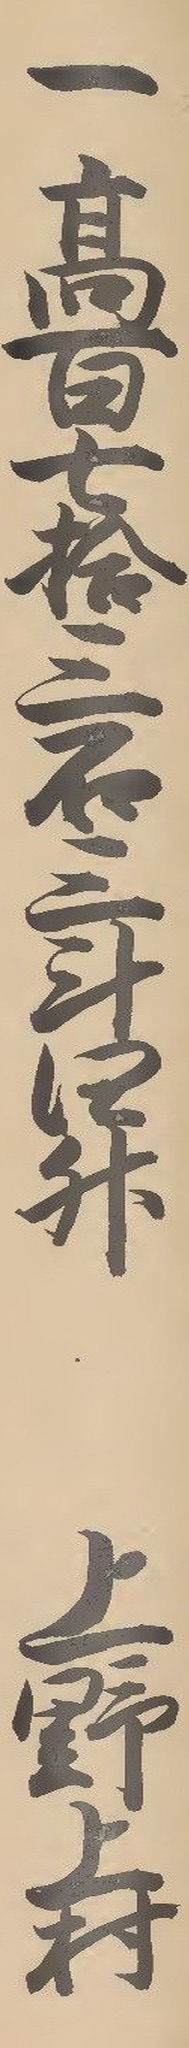一髙百七拾三石三斗四升上野上村
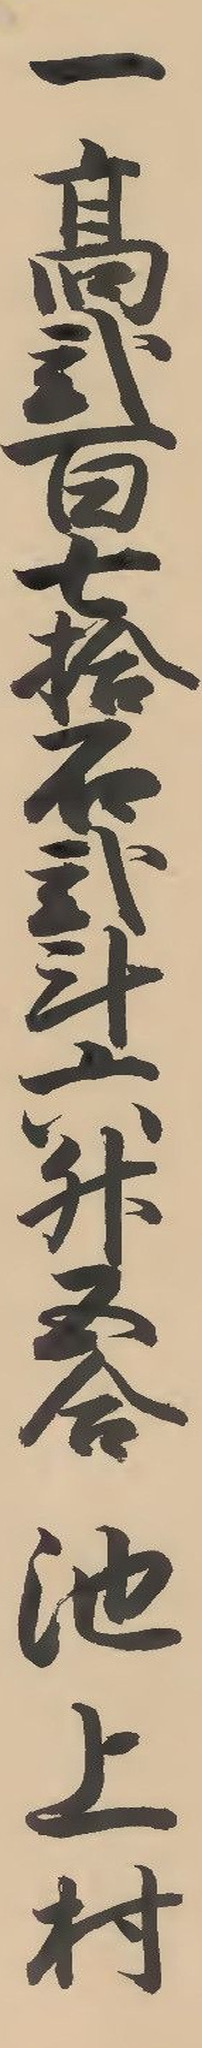一髙弐百七拾石弐斗六升五合池上村
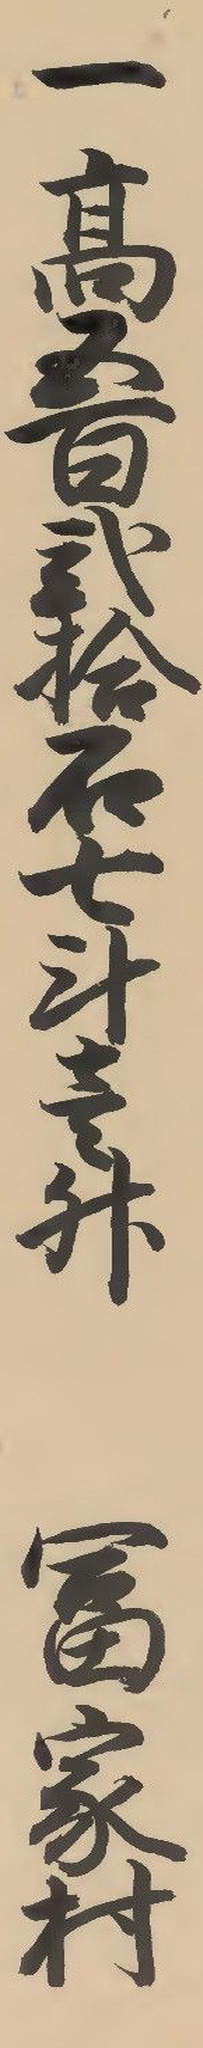一髙五百弐拾石七斗壱升冨家村
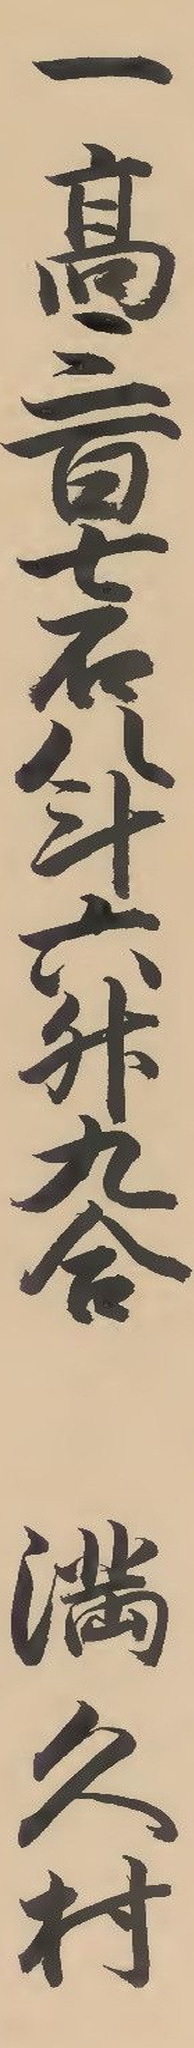一髙三百七石八斗六升九合満久村

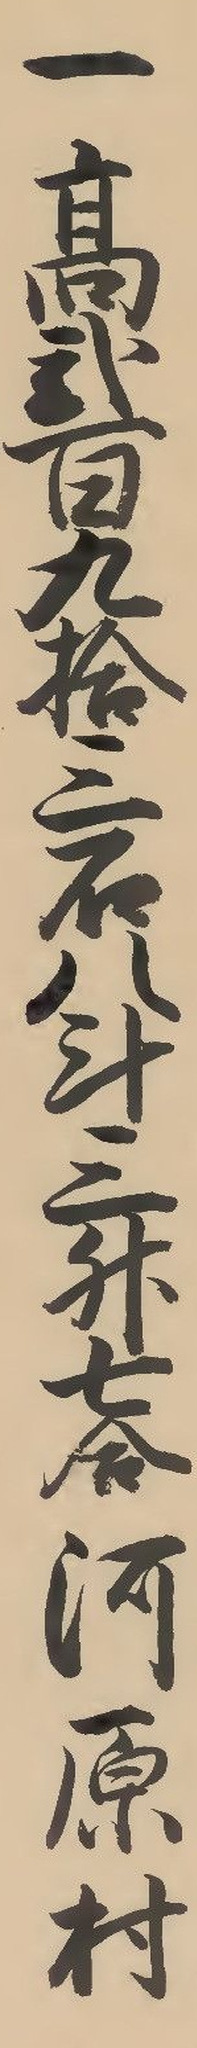一髙弐百九拾三石八斗三升七合河原村
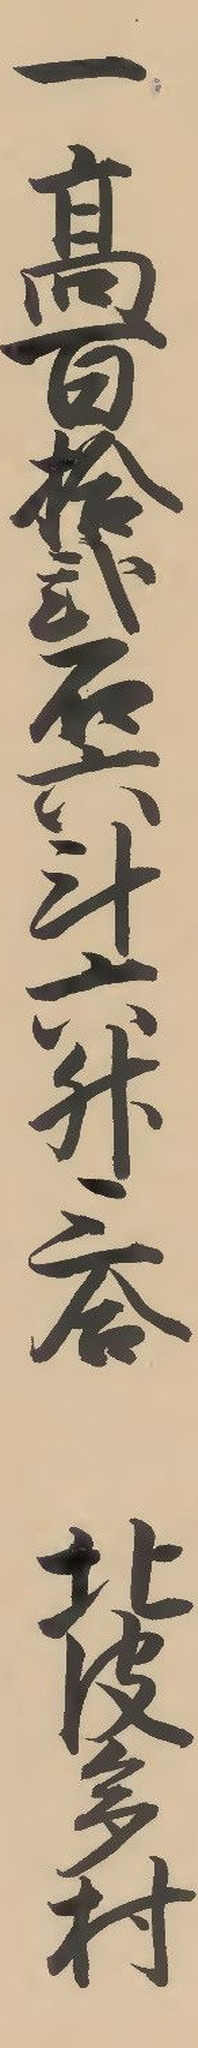一髙百拾弐石六斗六升三合北皮多村
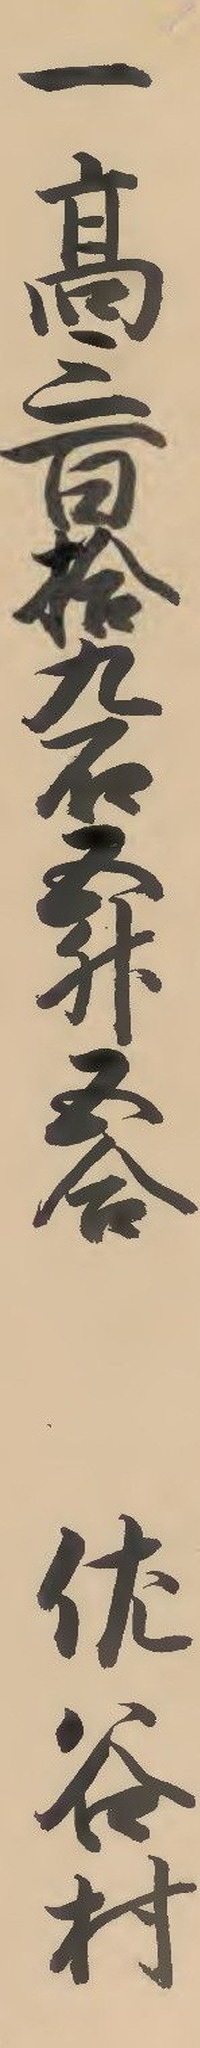一髙三百拾九石五升五合佐谷村
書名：播磨国郷帳
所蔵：国立公文書館 National Archives of Japan
